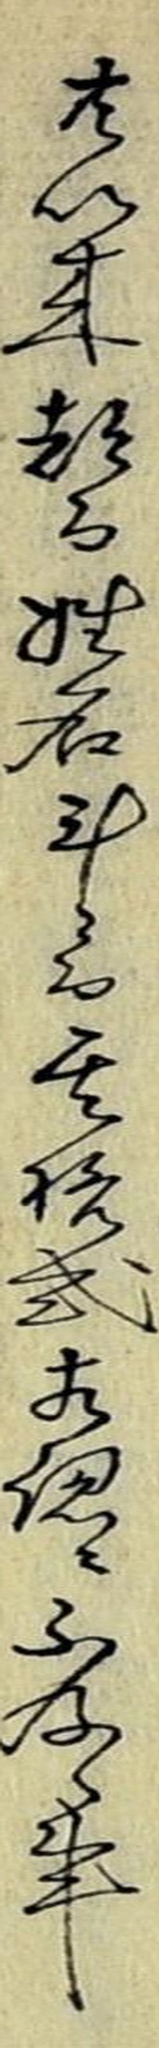共以来都而姓名斗に而其格式相認に不及候事
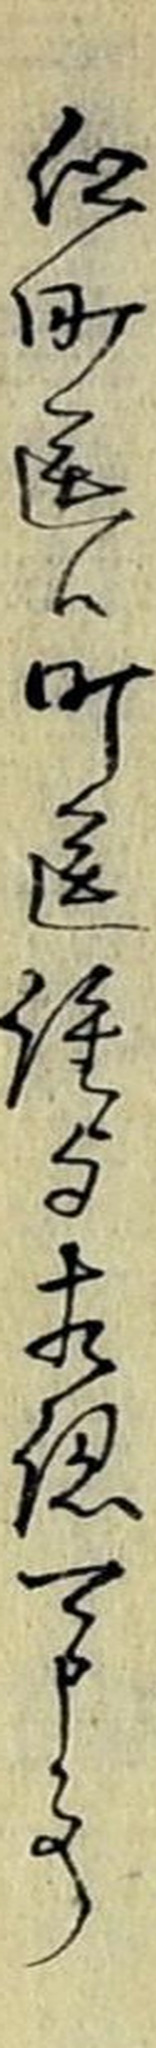但町医は町医誰と相認可申事
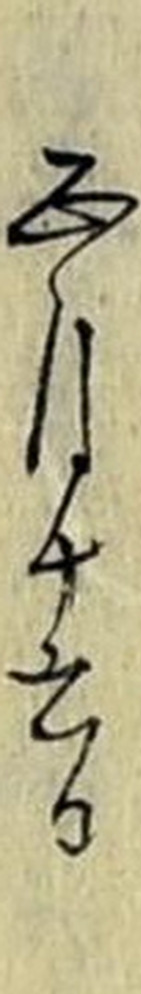正月十六日
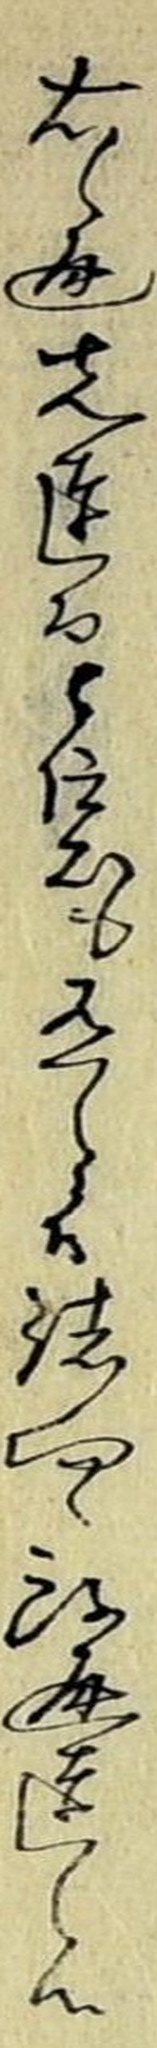右之通先達而被仰出も有之候に付諸向へ致通達候
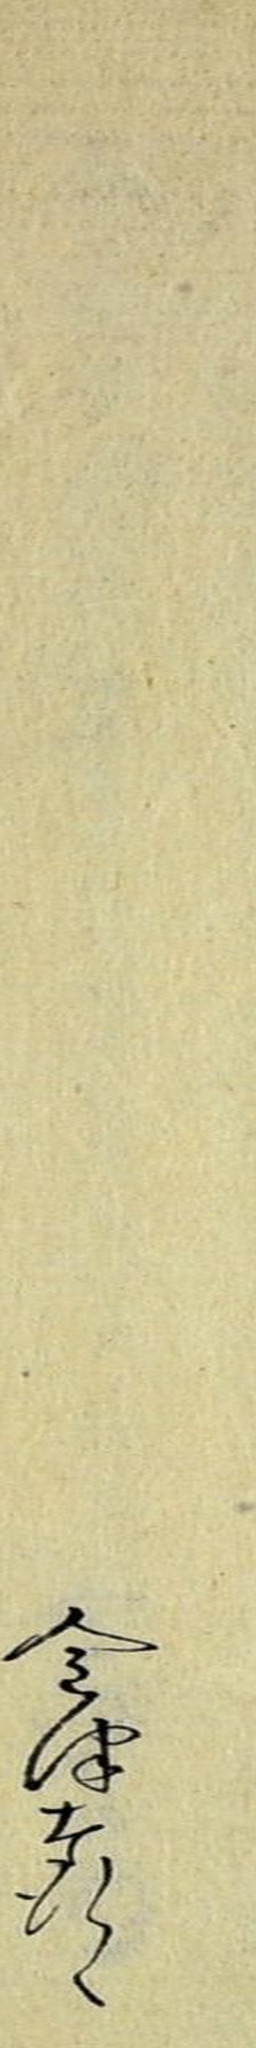金津奉行へ
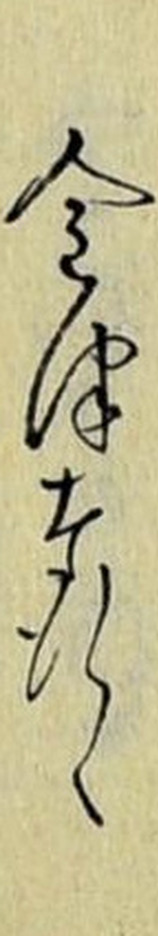金津奉行へ
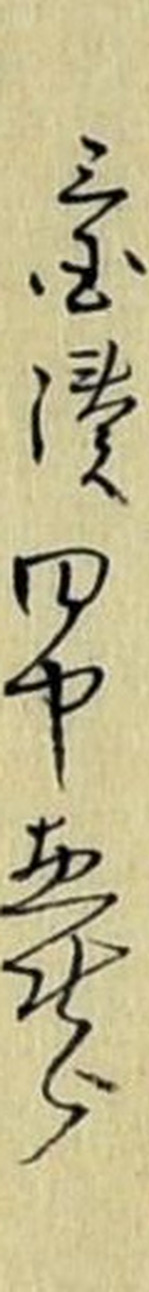三国湊田中惣次郎
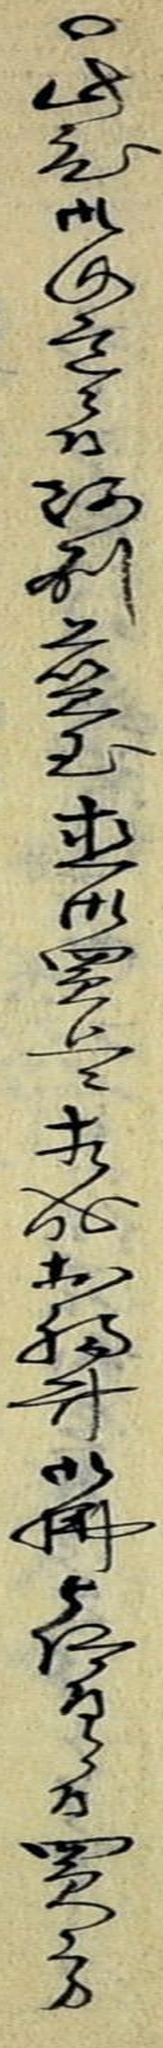○此度御趣意に付格別藍玉直御買上に相成於福井御払被仰付候に付買方
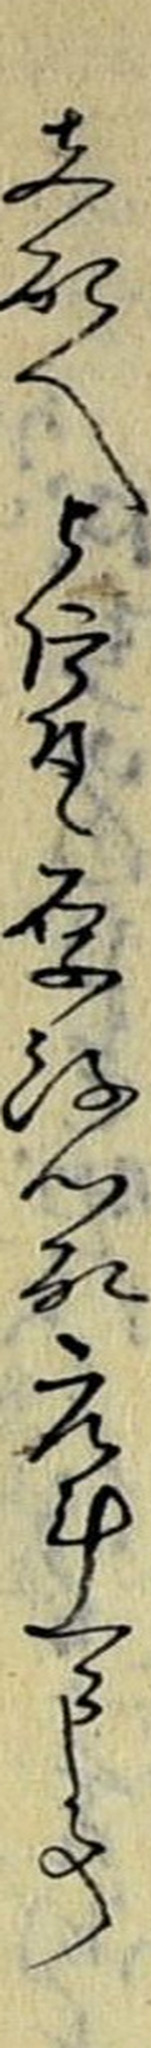支配人被仰付候厚致心配取斗可申事
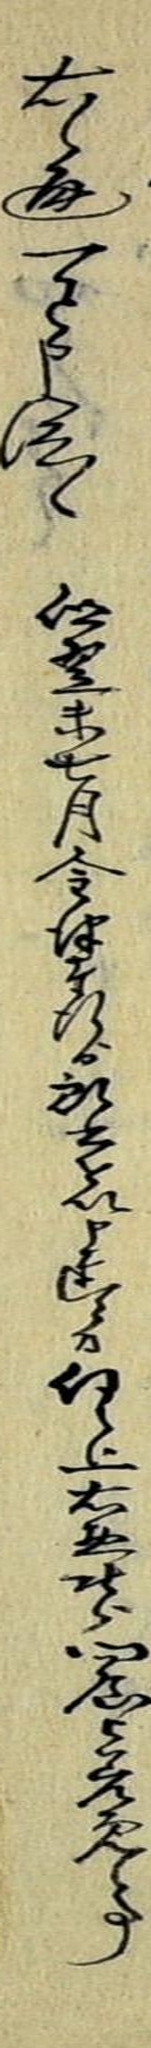右之通可被仰渡候但翌未七月金津奉行ゟ願書を以申達候に付伺之上右惣次郎問屋被差免候事
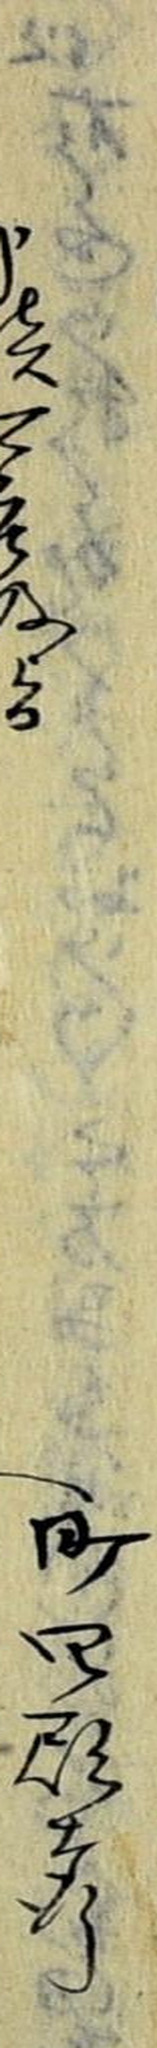申談可取扱旨町四郡奉行
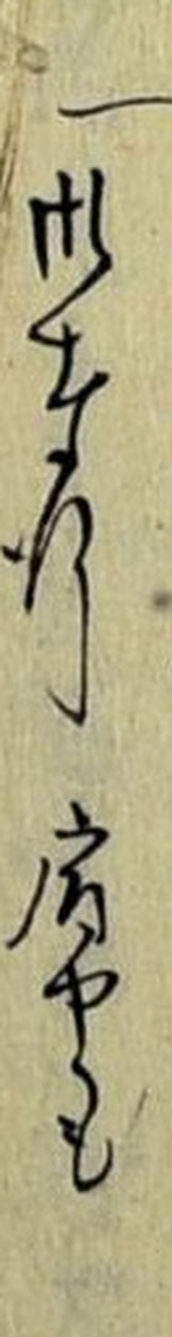御奉行府中へも
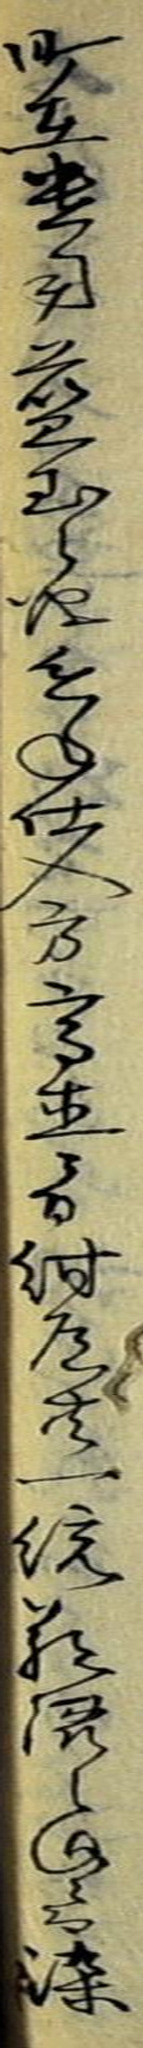○町在遣用藍玉之儀近年仕入方高直に付紺屋共一統難渋之趣に而染
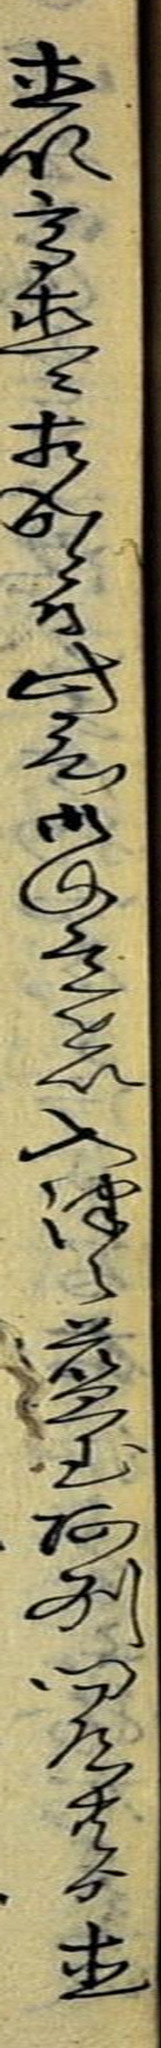直段高直に相成候に付此度御趣意を以入津之藍玉阿州問屋共ゟ直
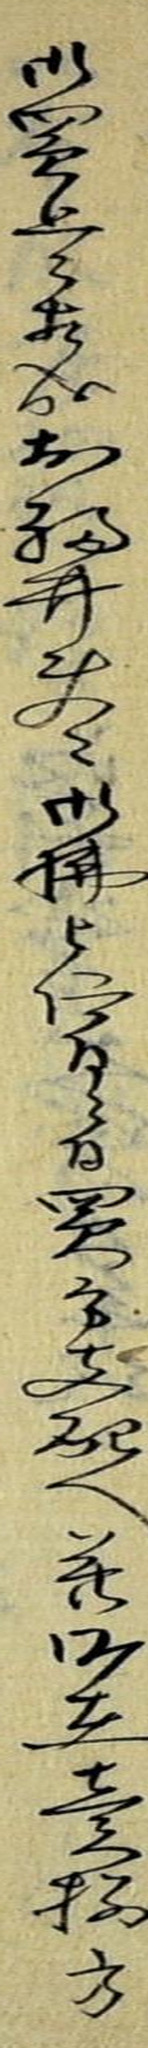御買上に相成於福井夫々御払被仰付候に付買方支配人并町在売捌方
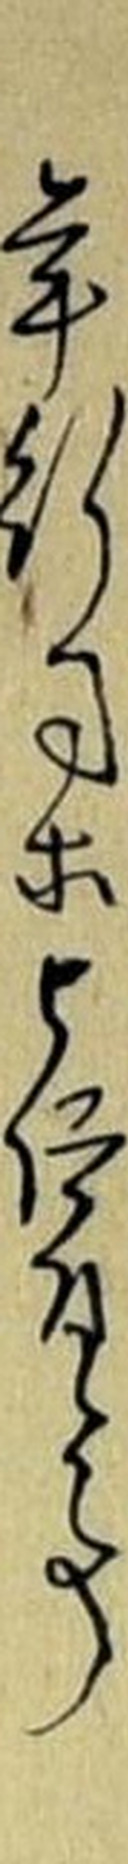年行司等被仰付候事
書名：命令之部 四
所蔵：福井県文書館 Fukui Prefectural Archives
